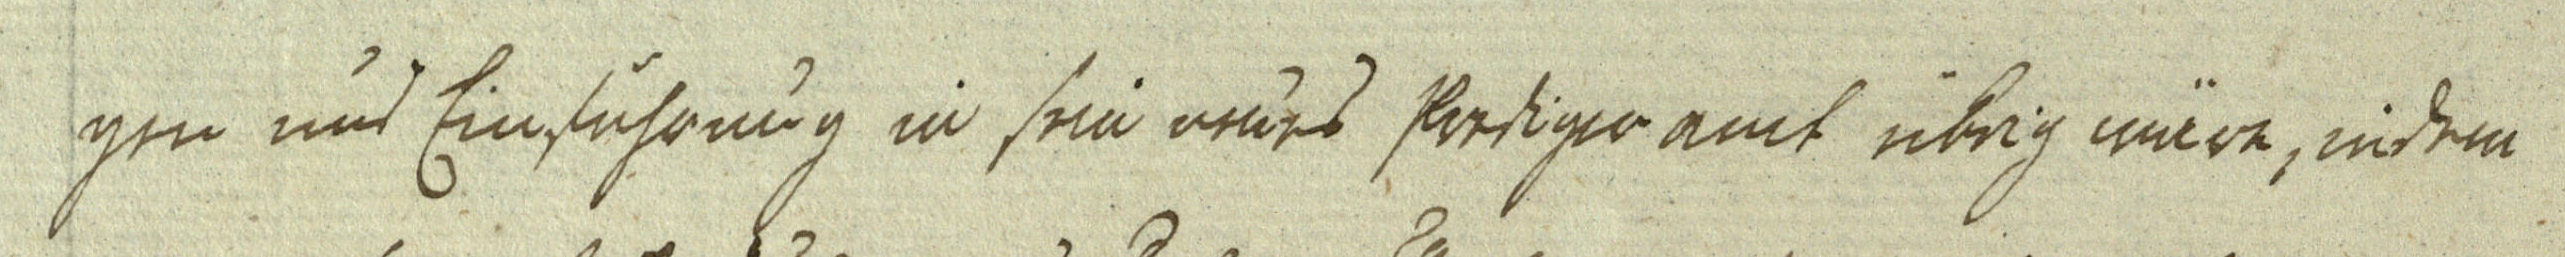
gen und Einführung in sein neues Predigeramt übrig wäre, indem
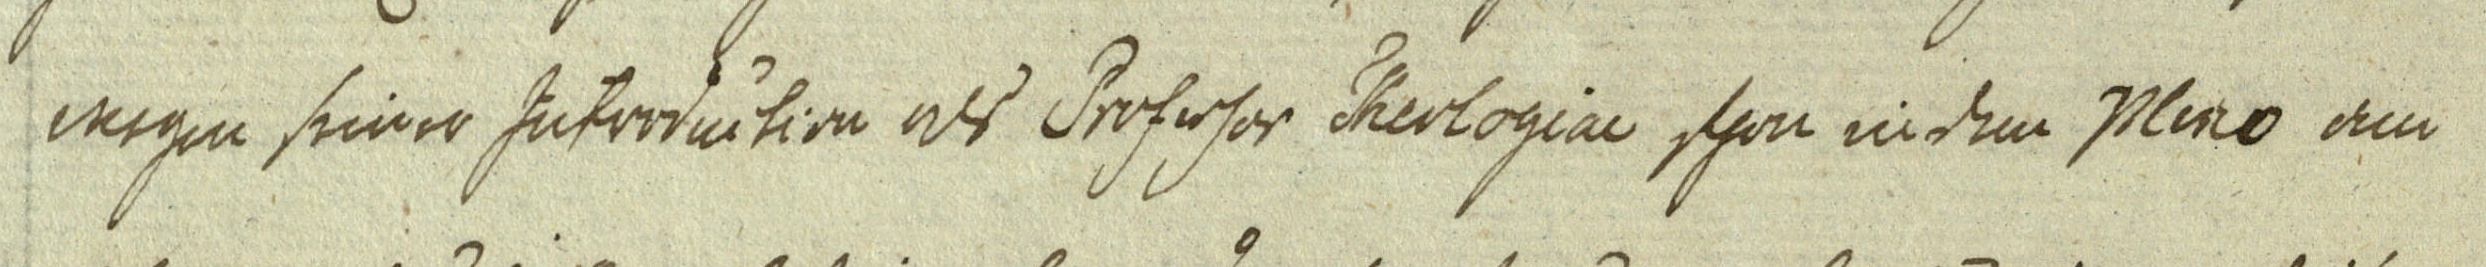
wegen seiner Introduction als Professor Theologiae schon in dem Pleno am
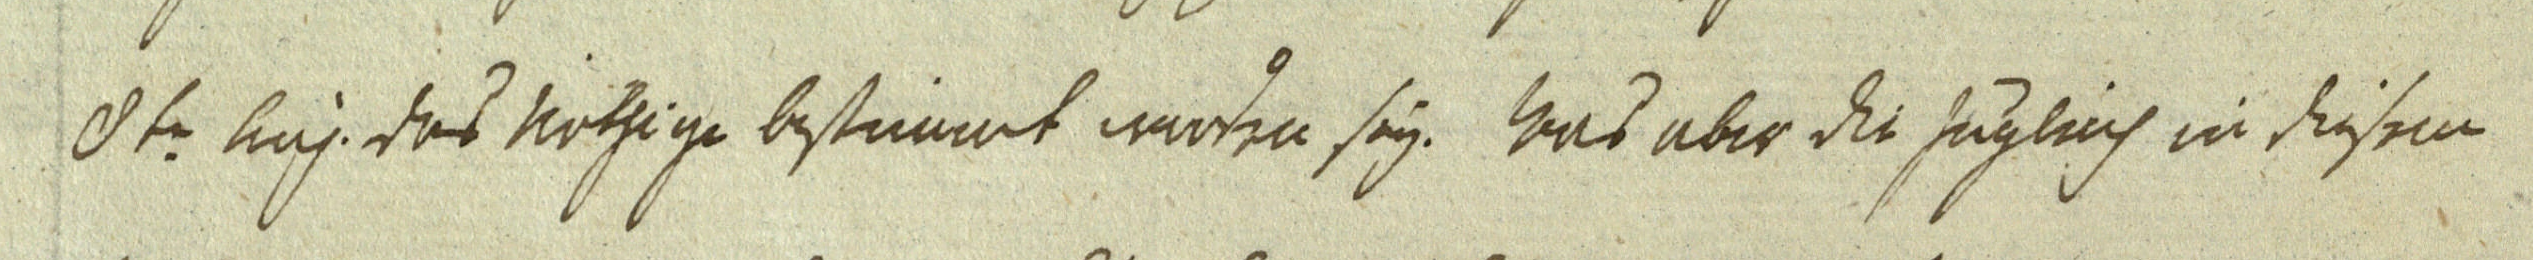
8 ten huj. des Nöthige bestimmt worden seÿ. Was aber die zugleich in diesem
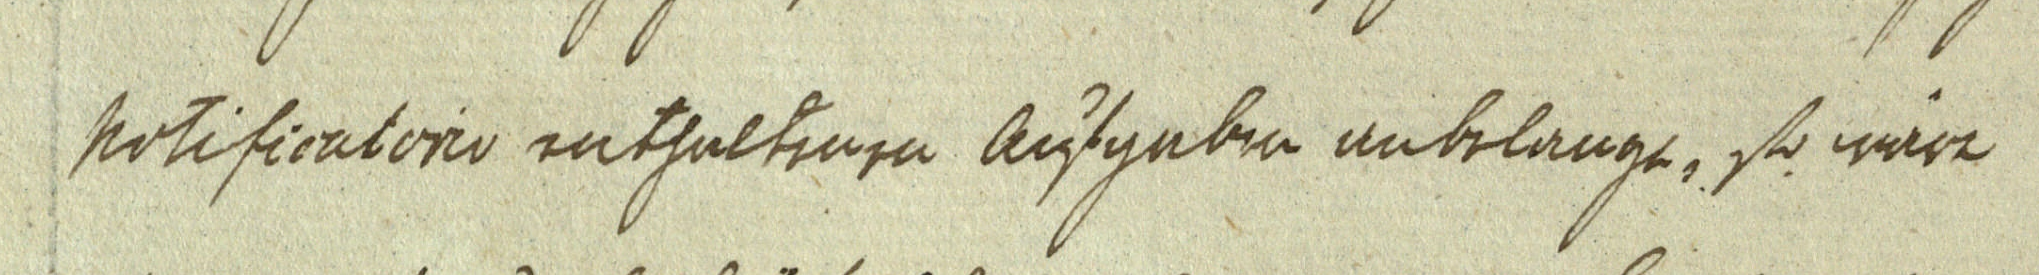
Notificatorio enthaltenen Aufgaben anbelange, so wäre
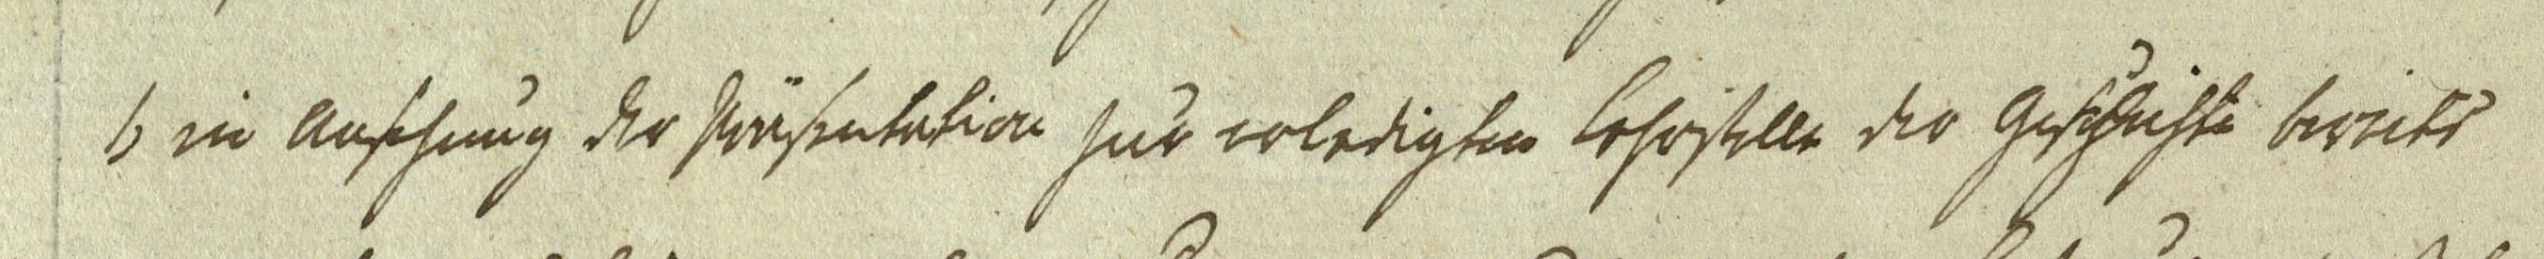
1, in Ansehung der Präsentation zur erledigten Lehrstelle der Geschichte bereits
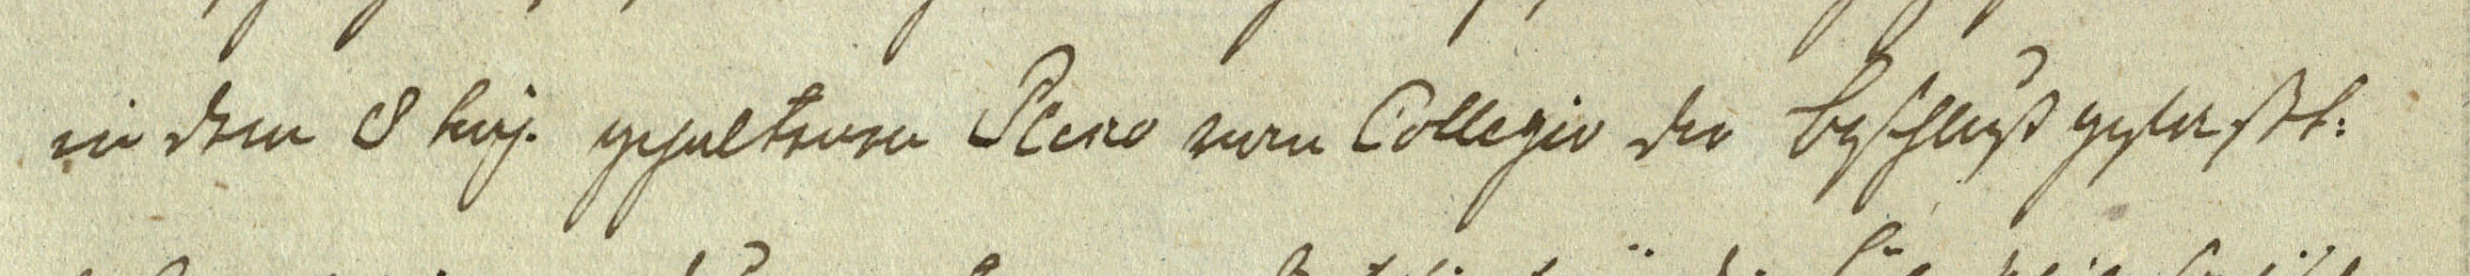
in dem 8 huj. gehaltenen Pleno vom Collegio der Beschluß gefaßt,
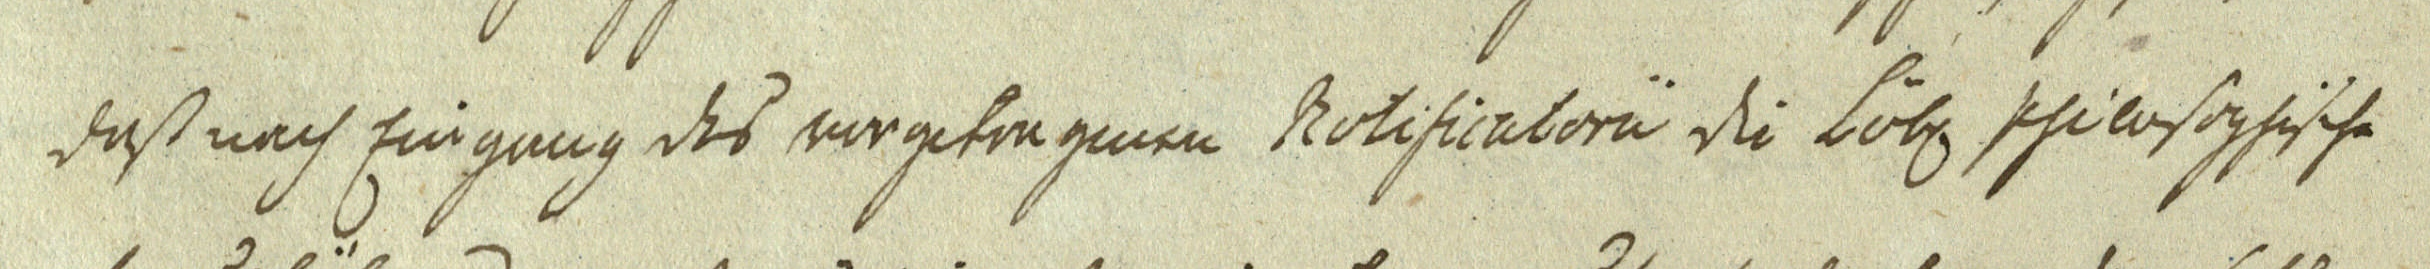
daß nach Eingang des vorgetragenen Notificatorii die Löbl Philosophische
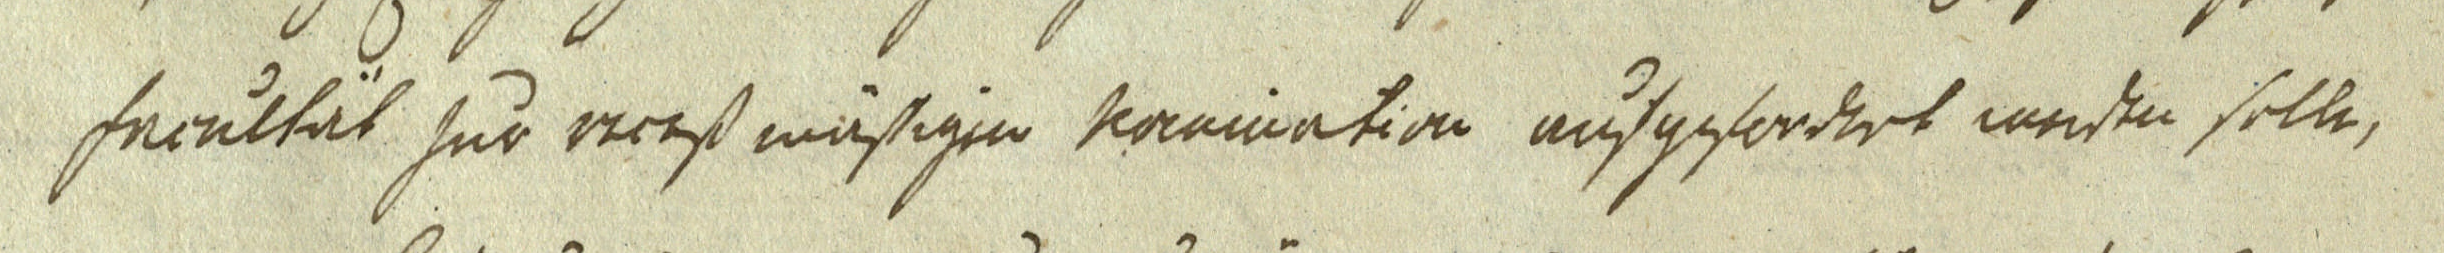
Facultät zur receßmässigen Nomination aufgefordert werden solle,
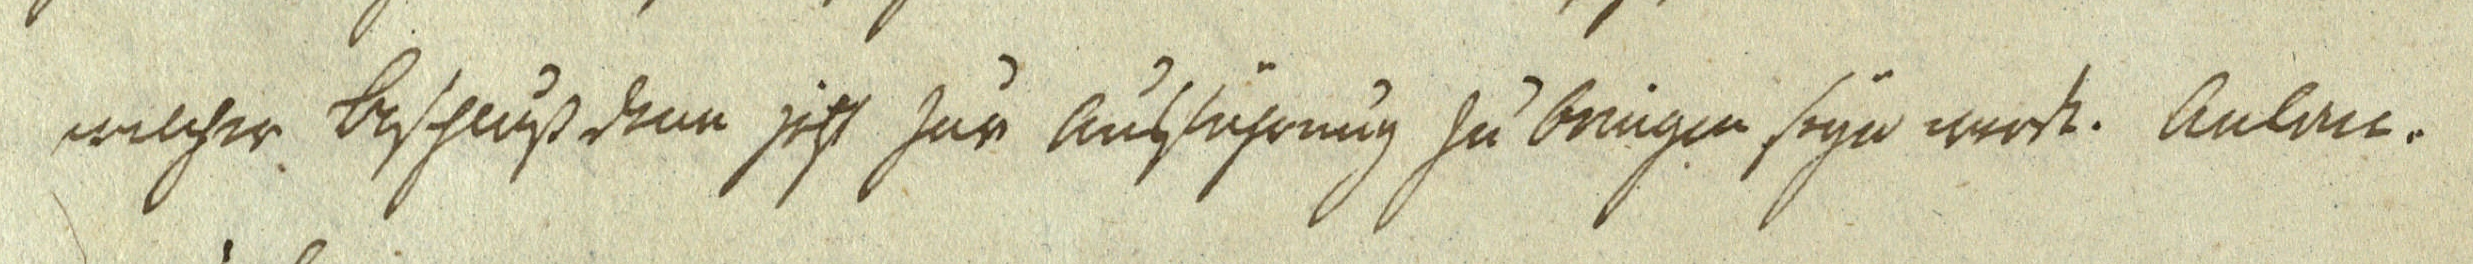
welcher Beschluß dem jetzt zur Ausführung zu bringen seÿn werde. Anlan¬
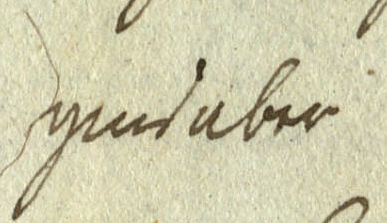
gend aber
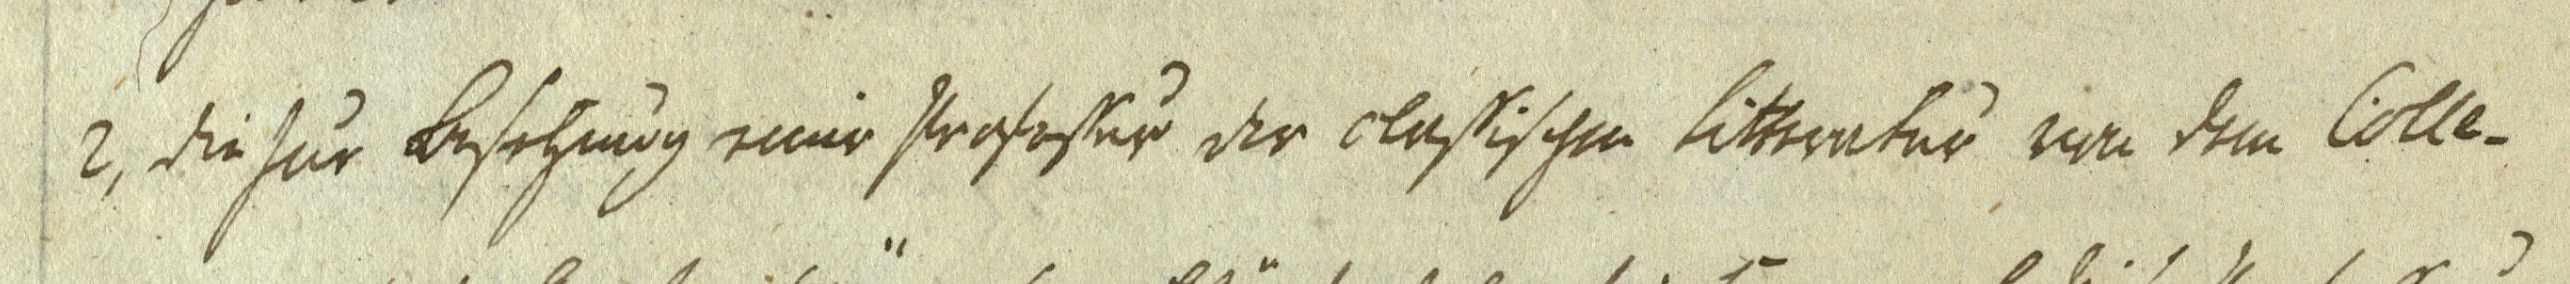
2, die zur Besetzung einer Professor der classischen Litteratur von dem Colle¬
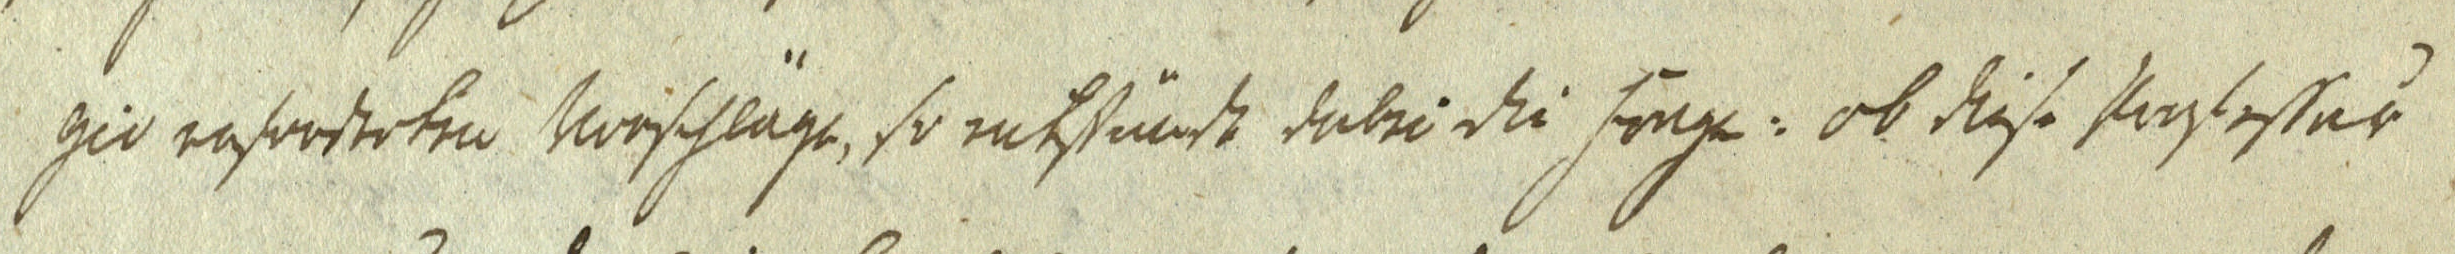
gio erforderten Vorschläge, so entstünde dabei die Frage: ob diese Professur
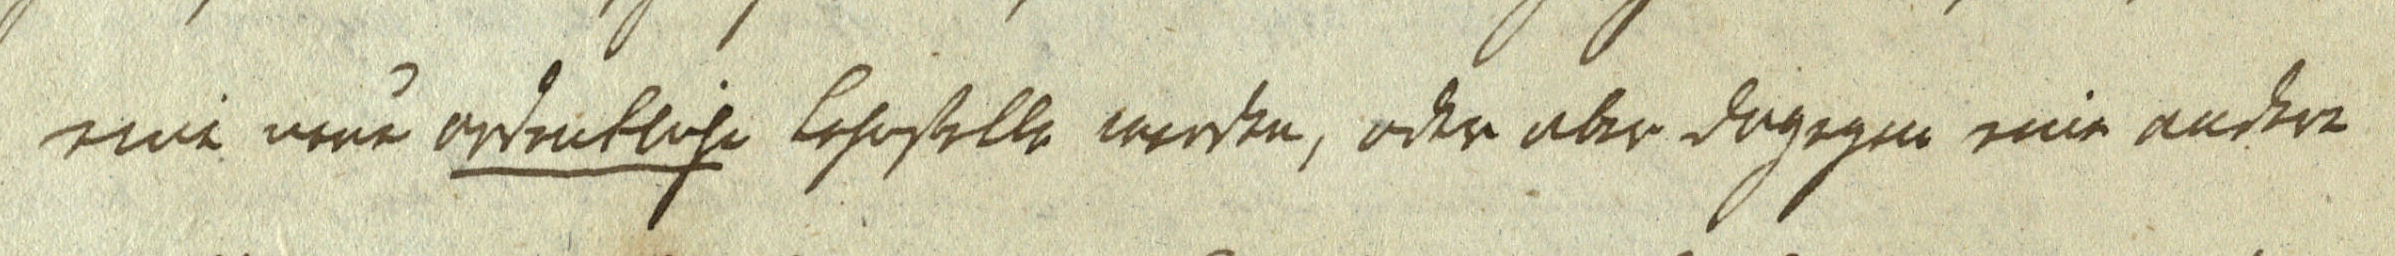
eine neue ordentliche Lehrstelle werden, oder aber dagegen eine andere
